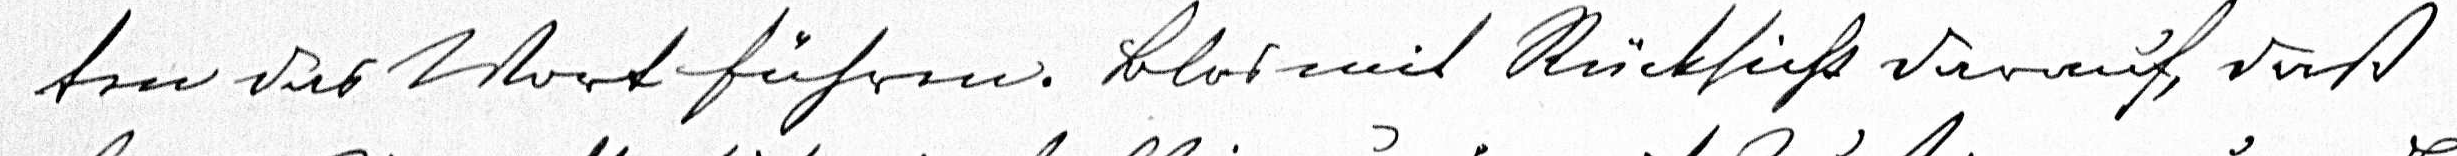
ten das Wort führen. Blos mit Rücksicht darauf, daß
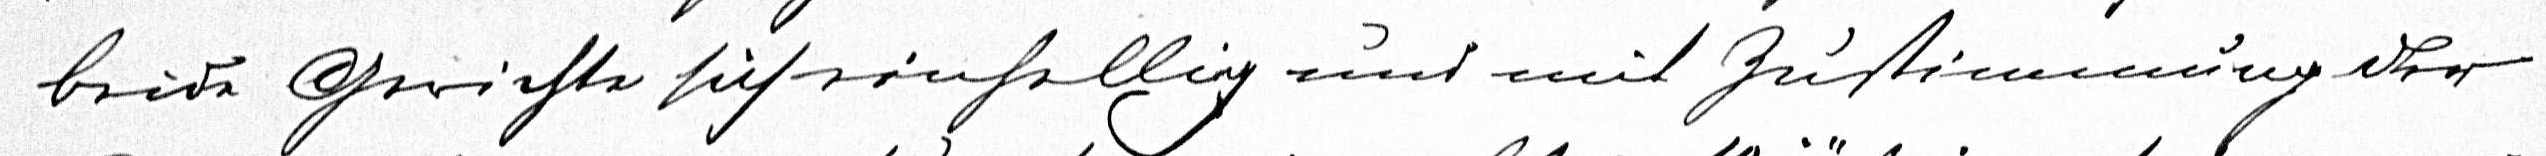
beide Gerichte sich einhellig und mit Zustimmung der
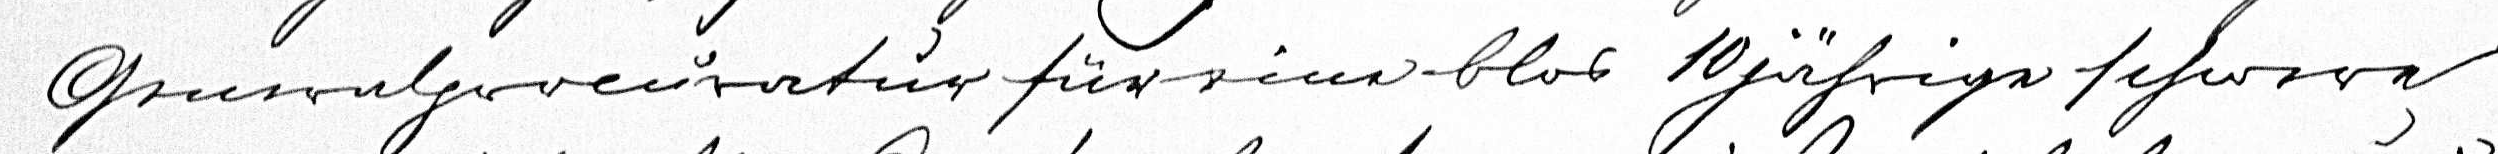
Generalprocuratur für eine blos 10jährige schwere
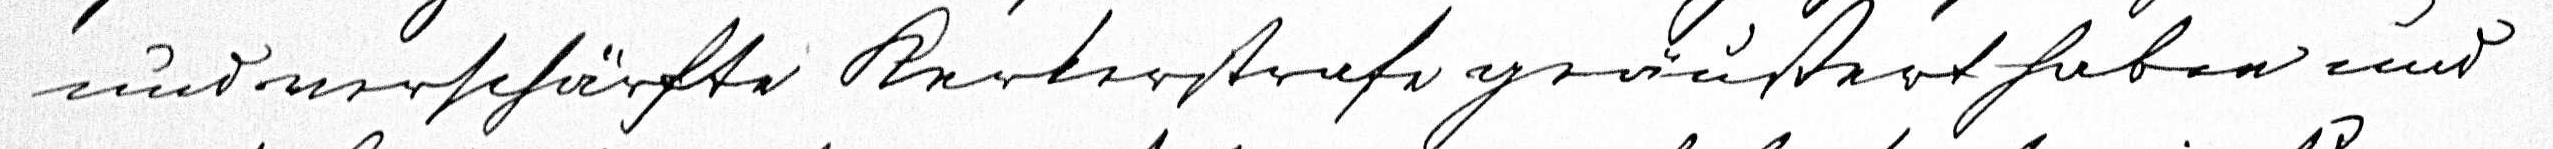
und verschärfte Kerkerstrafe geäußert haben und
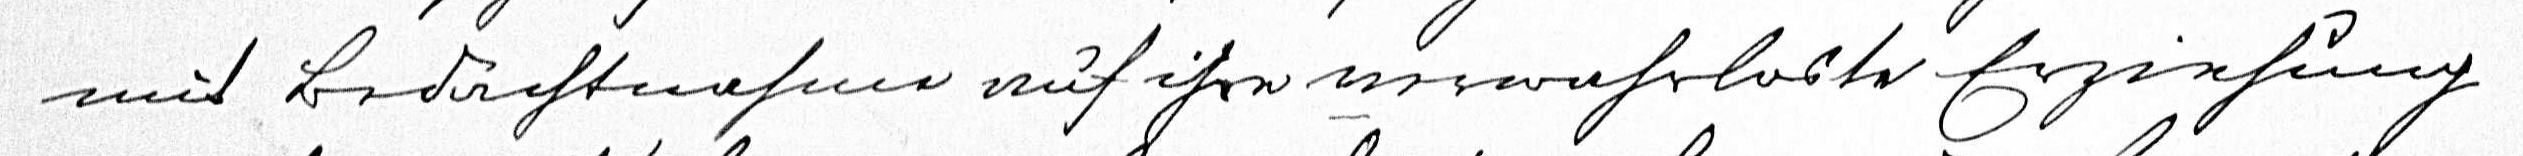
mit Bedachtnahme auf ihre verwahrloste Erziehung
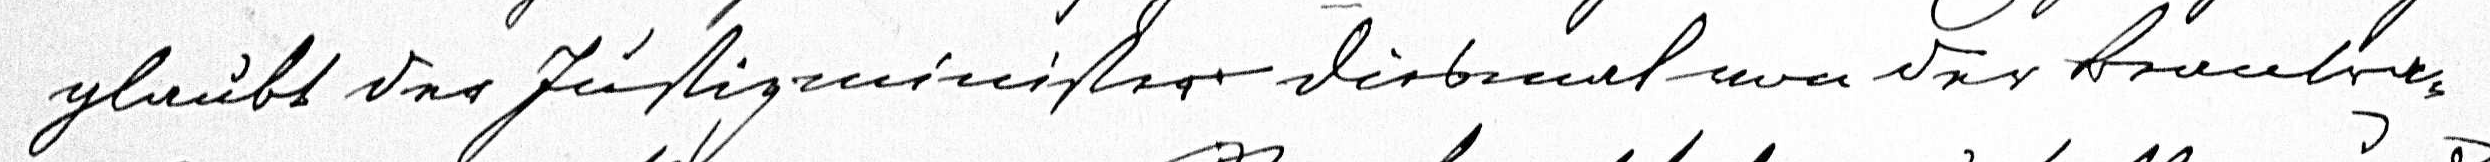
glaubt der Justizminister diesmal von der Beantra¬
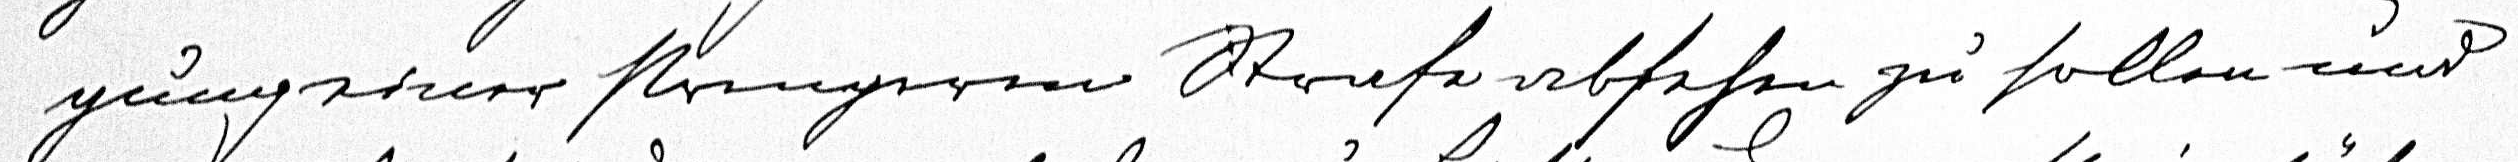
gung einer strengeren Strafe absehen zu sollen und
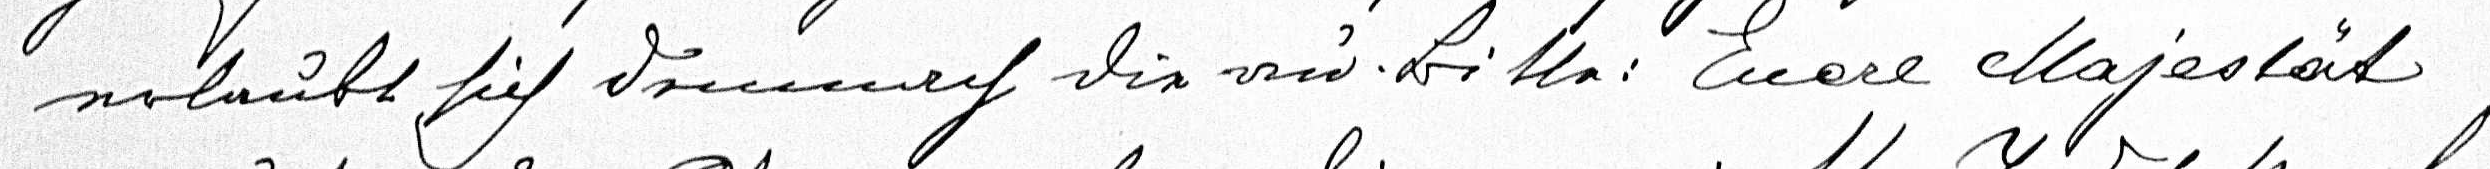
erlaubt sich demnach die au. Bitte: Euere Majestät
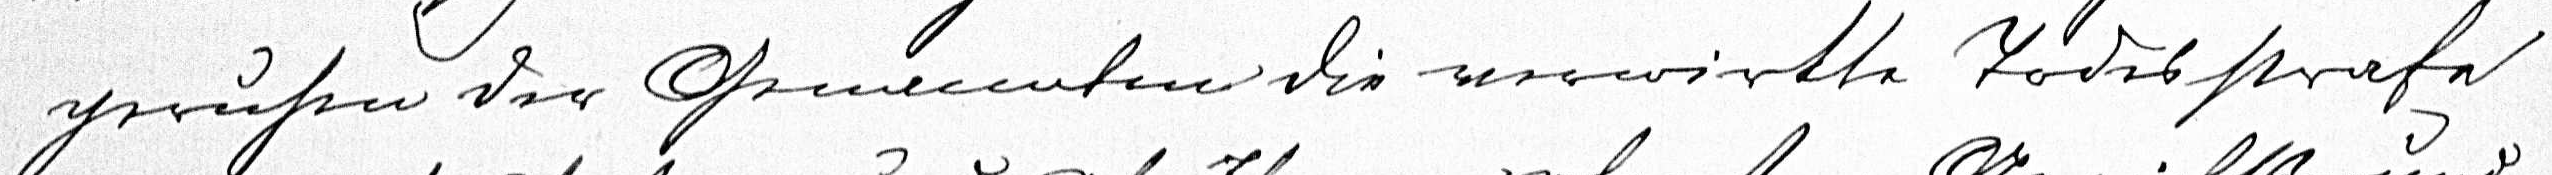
geruhen der Genannten die verwirkte Todesstrafe
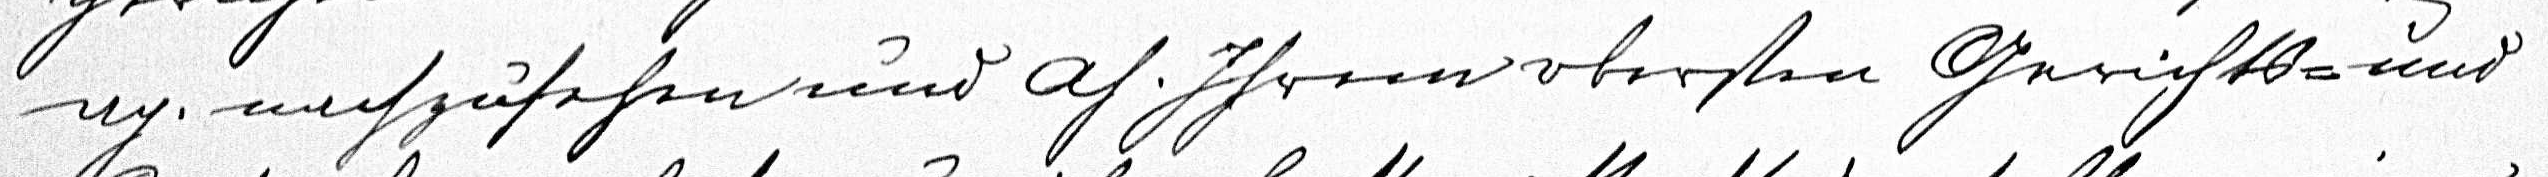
ag. nachzusehen und Ah. Ihrem obersten Gerichts- und
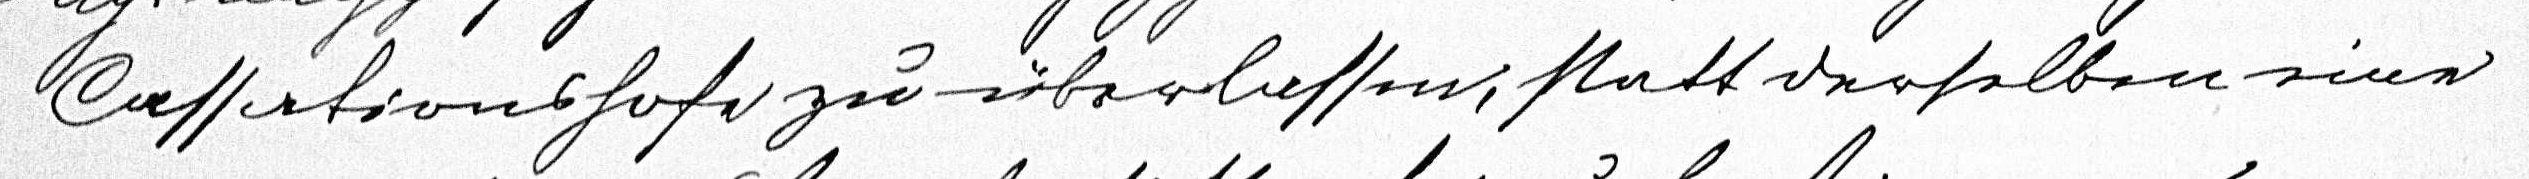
Cassationshofe zu überlassen, statt derselben eine
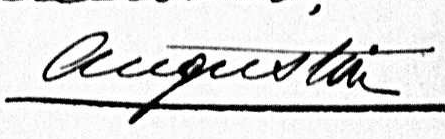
Augustin
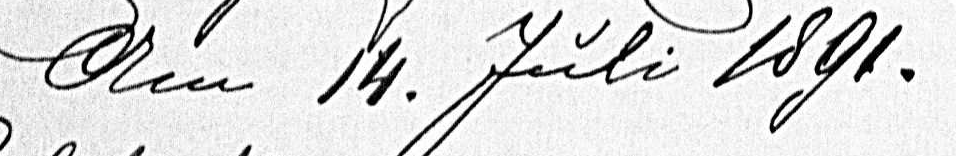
Am 14. Juli 1891
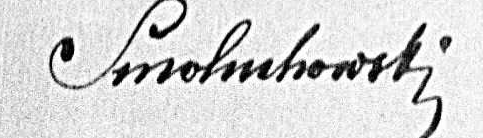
Smolnchowski
